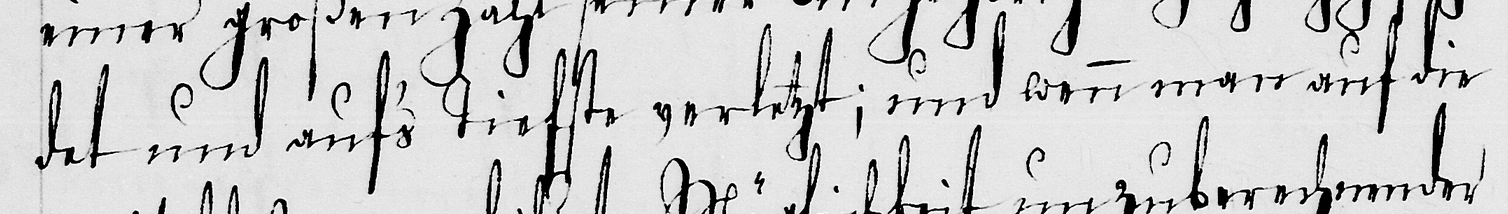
det und aufs Tiefste verletzt; und wenn man auf die
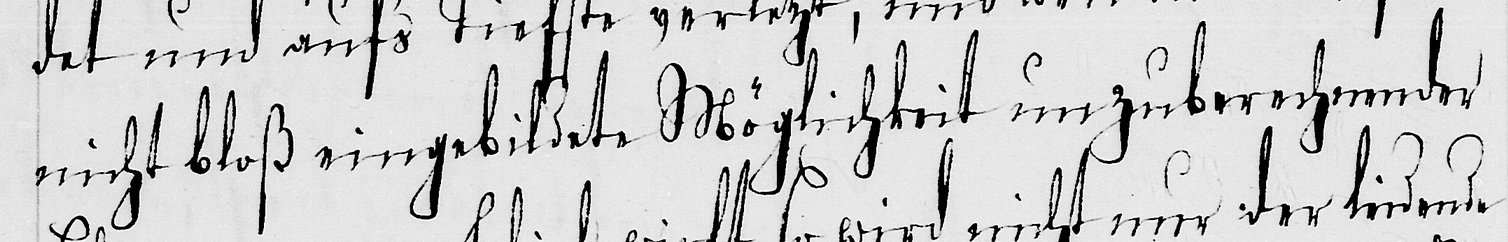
nicht bloß eingebildete Möglichkeit unzuberechnender
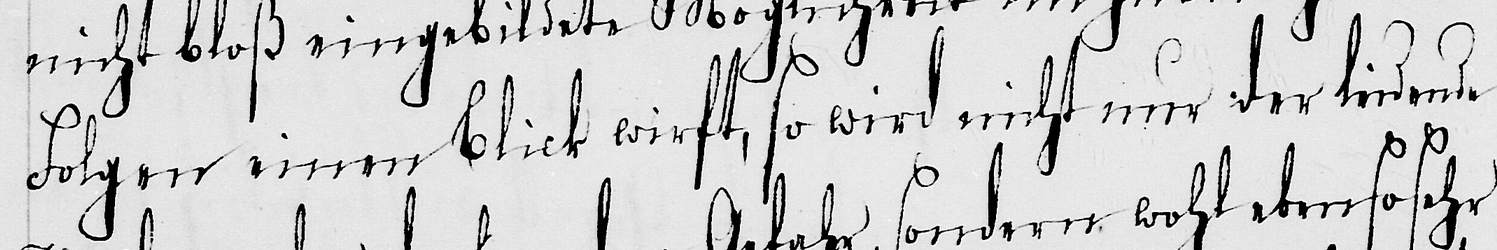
Folgen einen Blick wirft, so wird nicht nur der leidende
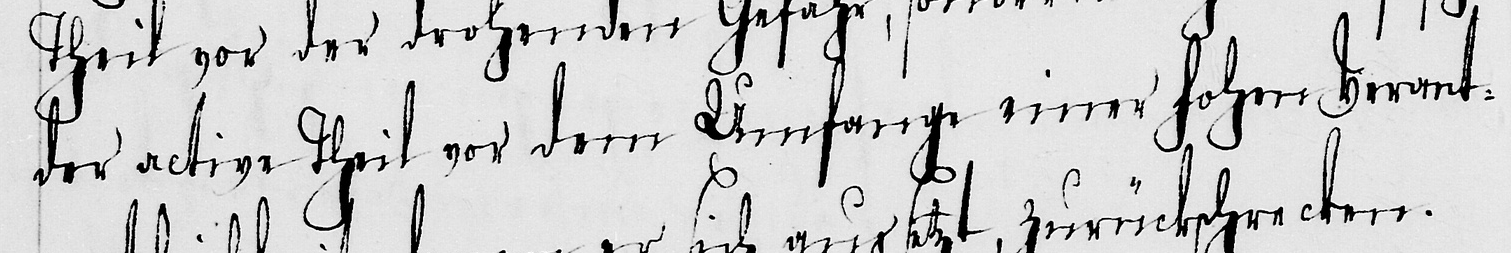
der active Theil vor dem Umfange einer hohen Verant¬
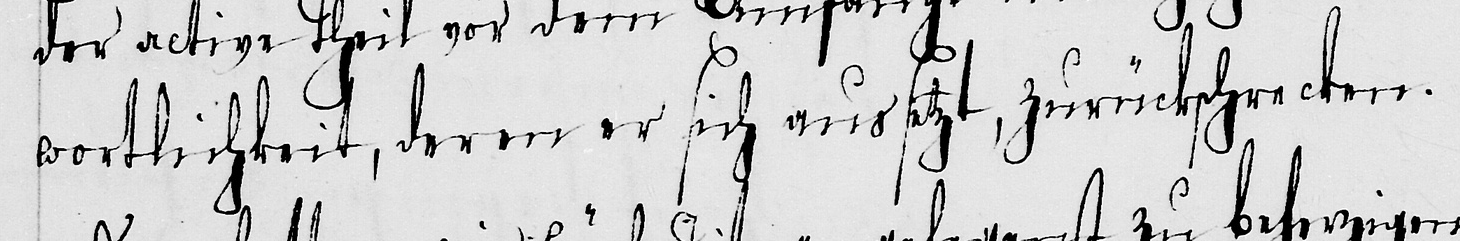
wortlichkeit, deren er sich aussetzt, zurückschrecken.
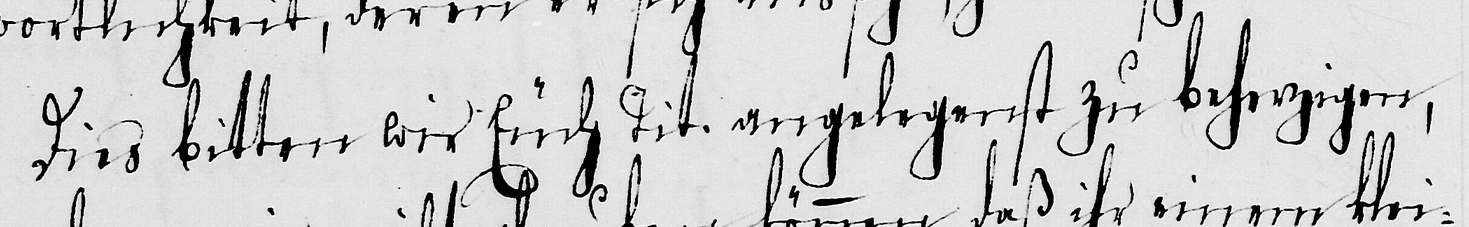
Dies bitten wird Euch Tit. angelegenst zu beherzigen,
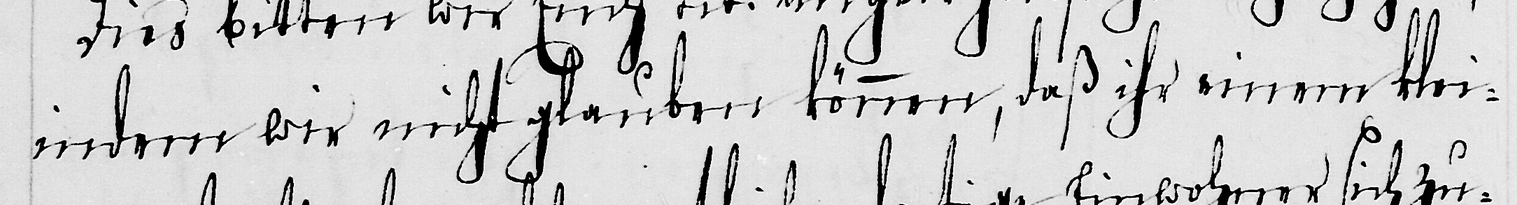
indem wir nicht glauben können, daß ihr einem klei¬
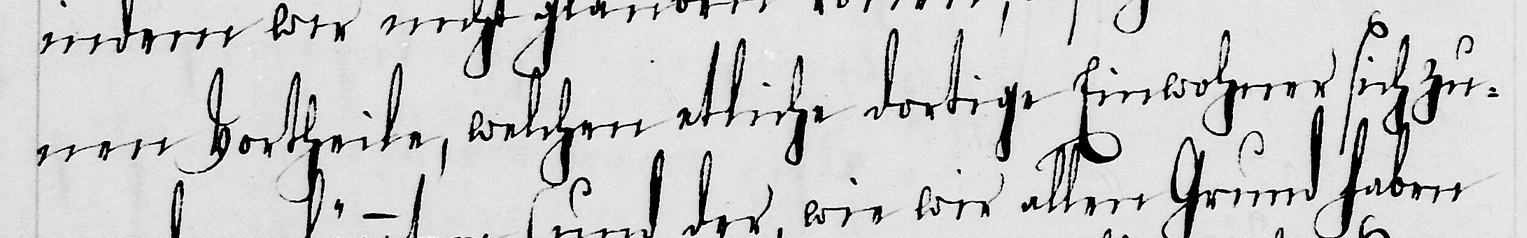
nen Vortheile, welchen etliche dortige Einwohner sich zu¬
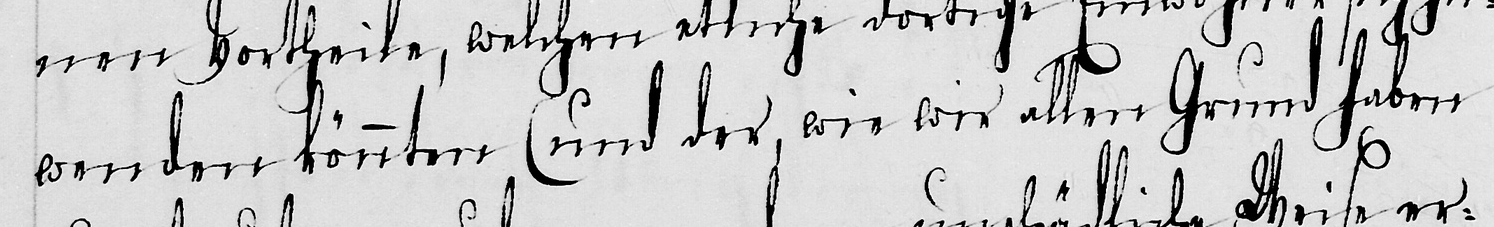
wenden könnten (und der, wie wir allen Grund haben
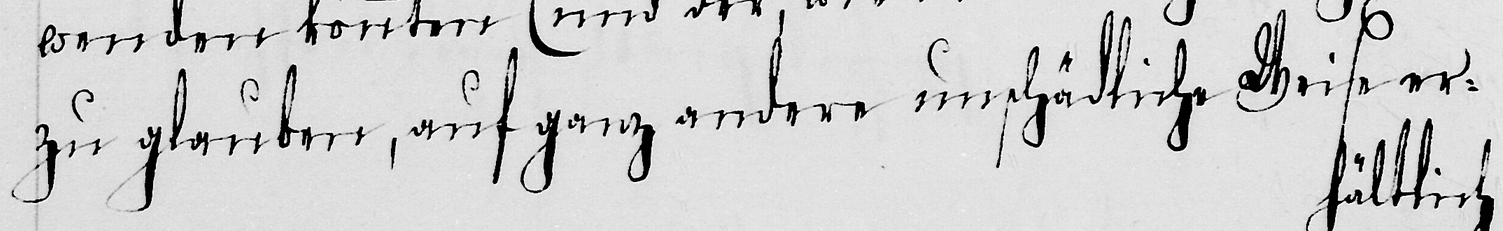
zu glauben, auf ganz andere unschädliche Weise er-
